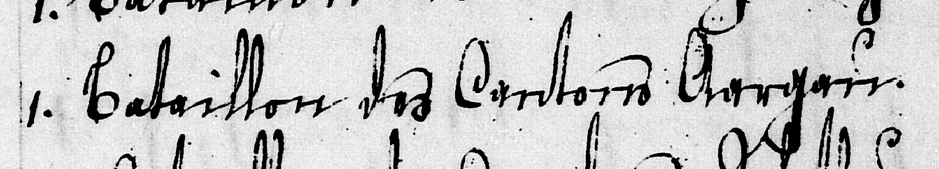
1. Bataillon des Cantons Aargau.
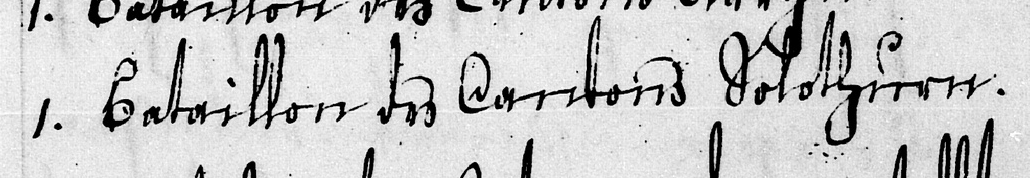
1. Bataillon des Cantons Solothurn.
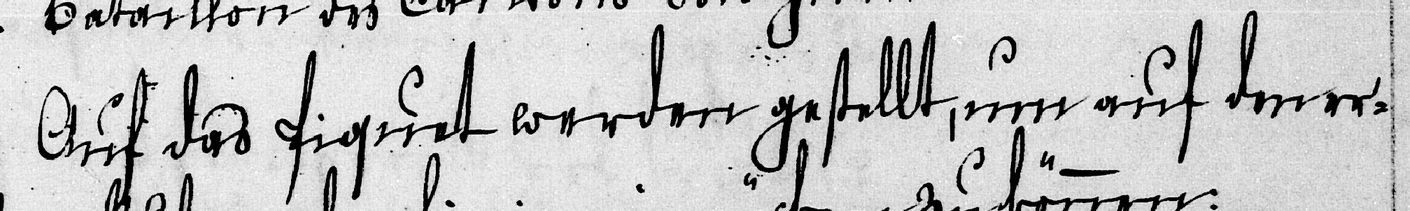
Auf das Piquet werden gestellt, um auf den er¬
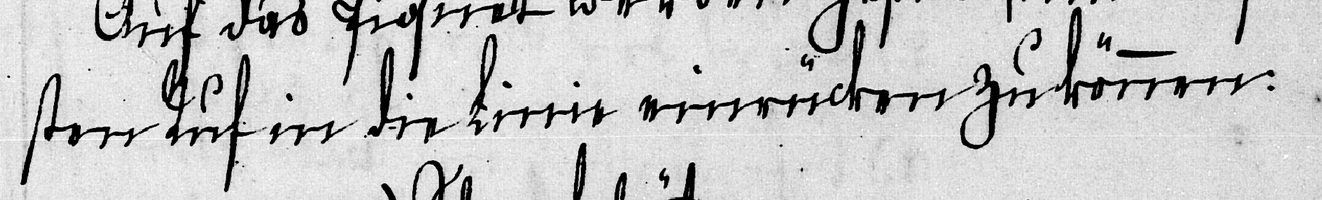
sten Ruf in die Linie einrücken zu können:
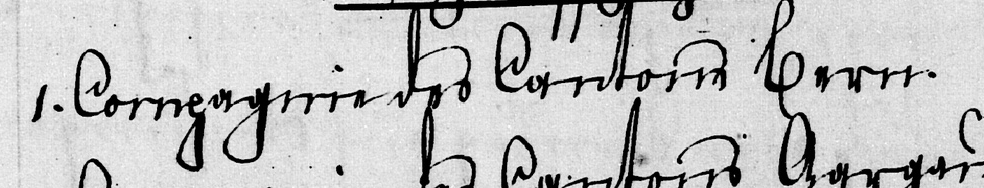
1. Compagnie des Cantons Bern.
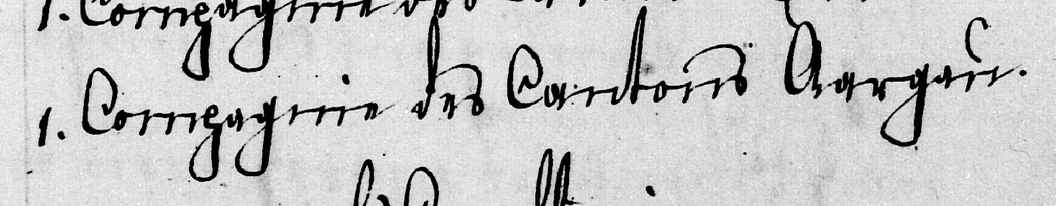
1. Compagnie des Cantons Aargau.
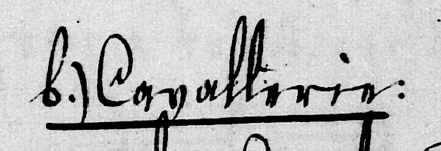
b.) Cavallerie:
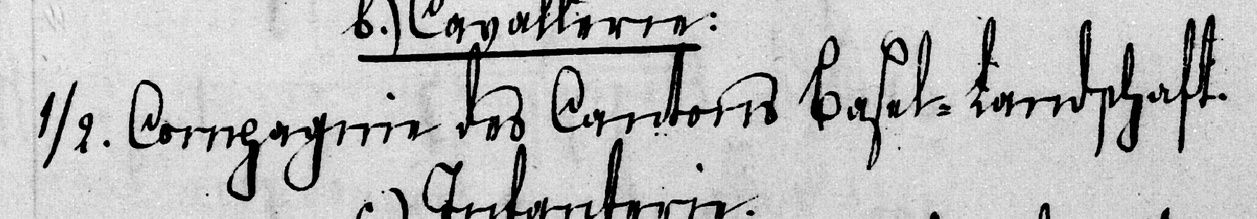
½ Compagnie des Cantons Basel-Landschaft.
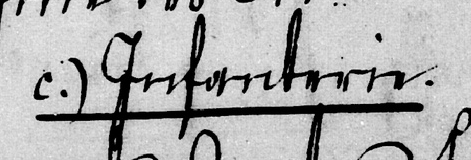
c.) Infanterie.
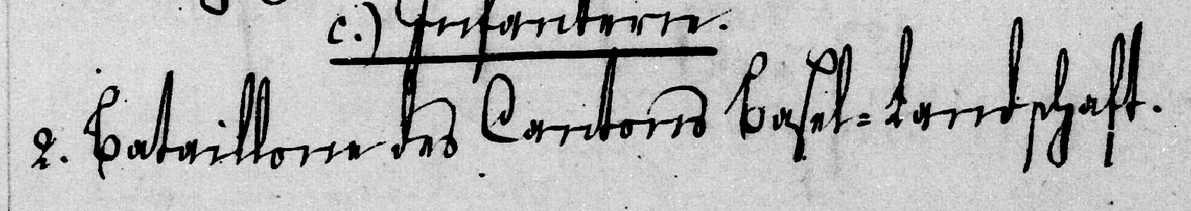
2. Bataillone des Cantons Basel-Landschaft.
